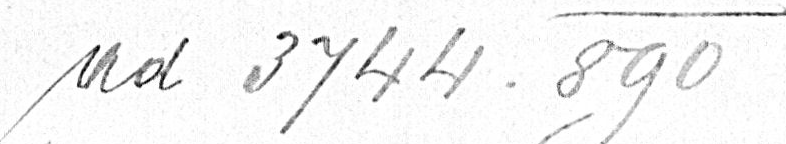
ad 3744.890
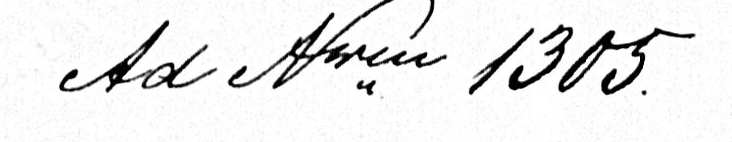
Ad Num. 1305.
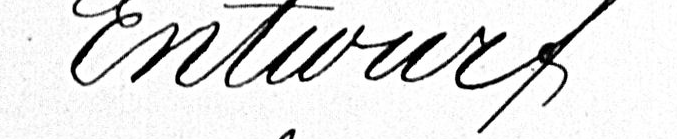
Entwurf
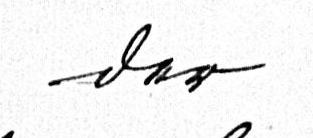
der
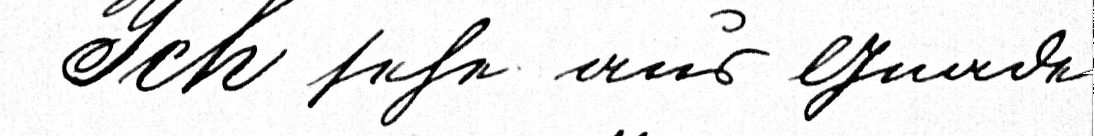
ich sehe aus Gnade
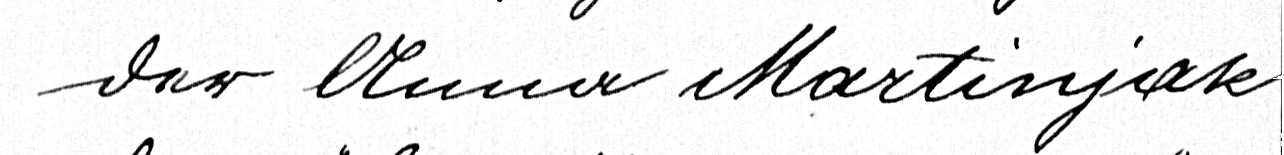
der Anna Martinjak
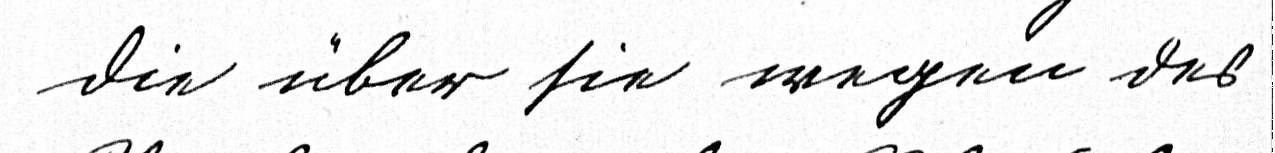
die über sie wegen des
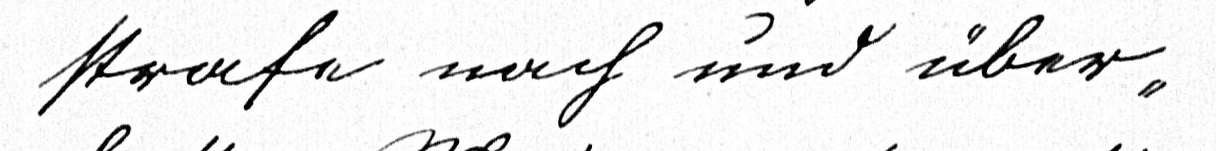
strafe nach und über¬
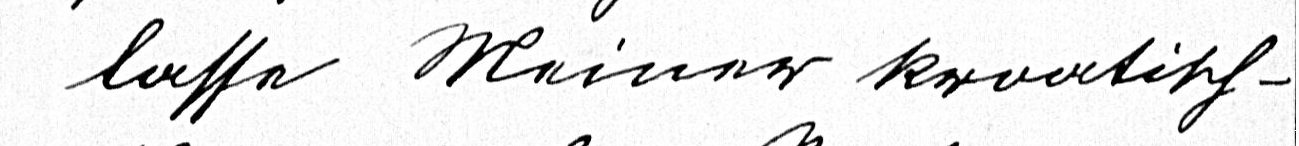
lasse Meiner kroatisch¬
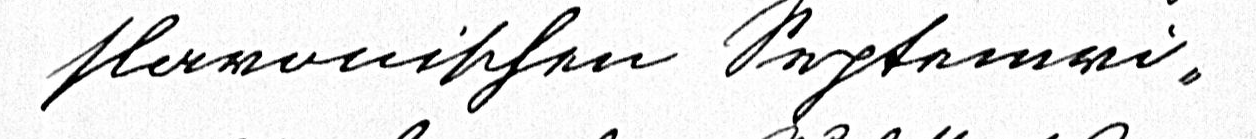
slavonischen Septemvi¬
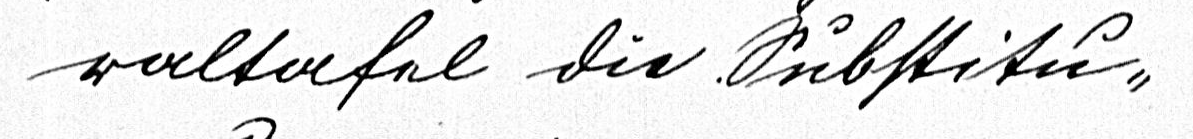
raltafel die Substitu¬
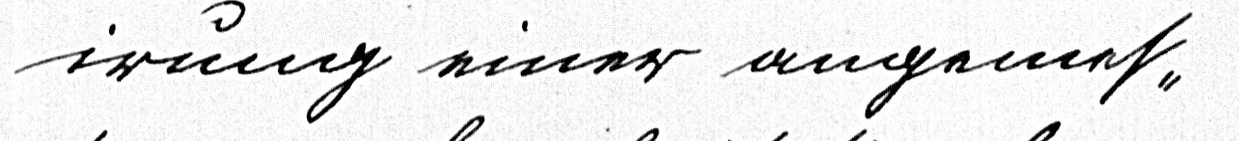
irung einer angemes¬
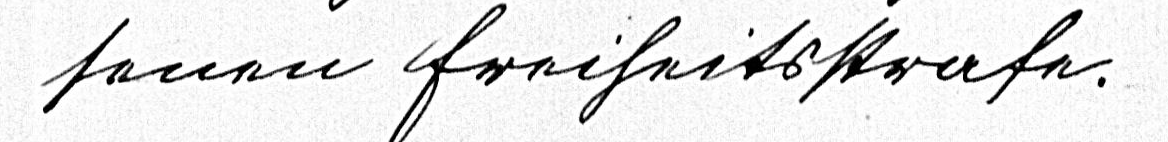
senen Freiheitsstrafe.
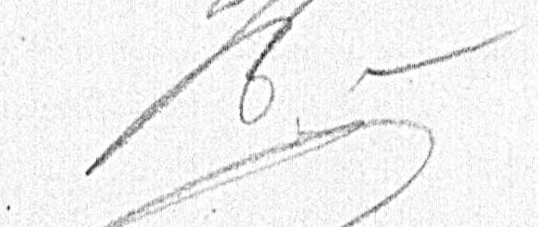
xx
